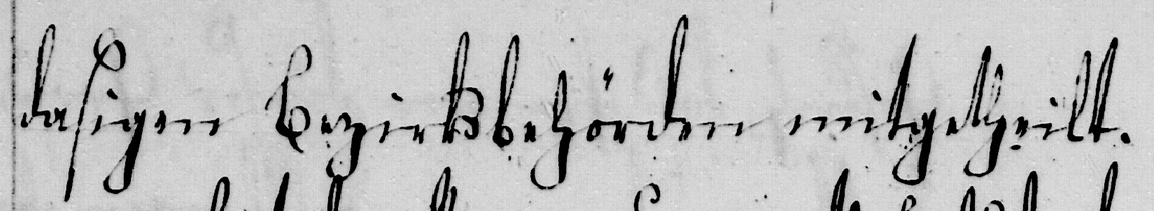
dasigen Bezirksbehörden mitgetheilt.
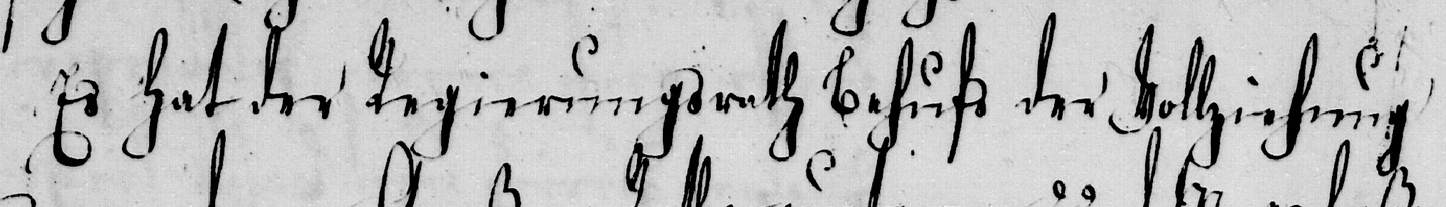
Es hat der Regierungsrath Behufs der Vollziehung
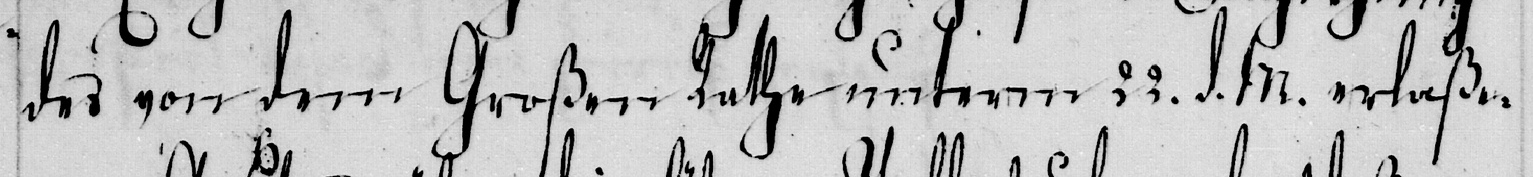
des von dem Großen Rathe unterm 22. d. M. erlaße¬
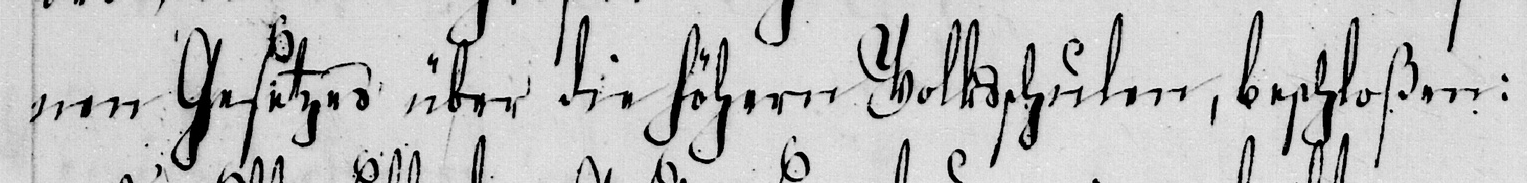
nen Gesetzes über die höhern Volksschulen, beschloßen:
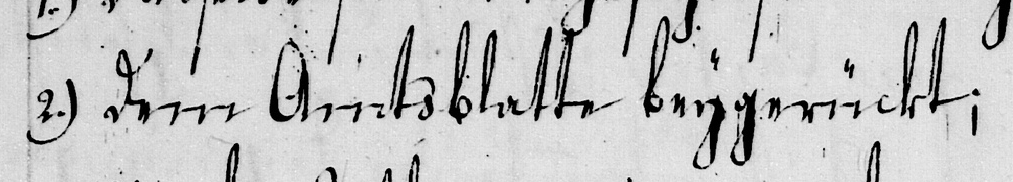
2.) Dem Amtsblatte beygerückt;
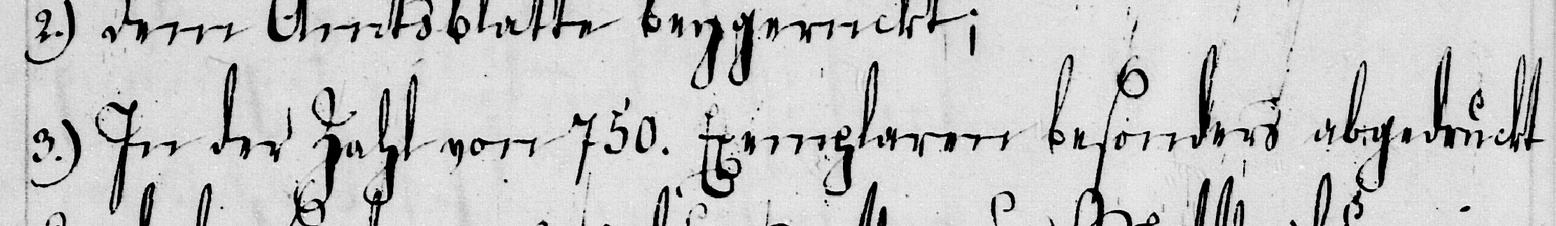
3.) In der Zahl von 750. Exemplaren besonders abgedruckt
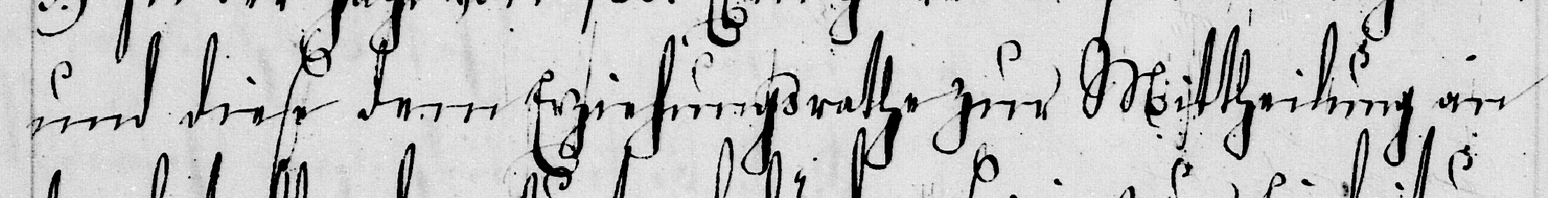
und diese dem Erziehungsrathe zur Mittheilung an
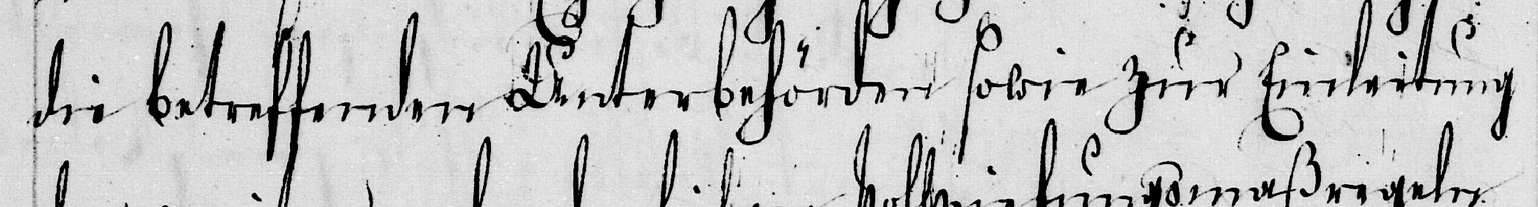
die betreffenden Unterbehörden sowie zur Einleitung
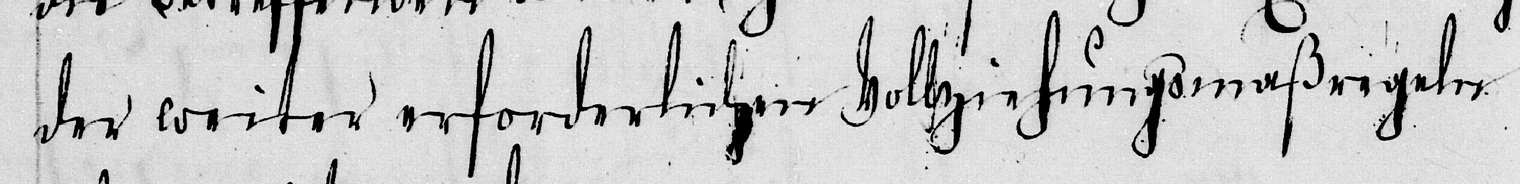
der weiter erforderlichen Vollziehungsmaßregeln
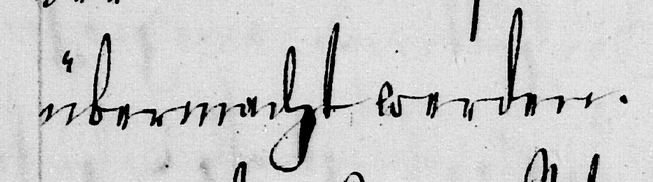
übermacht werden.
